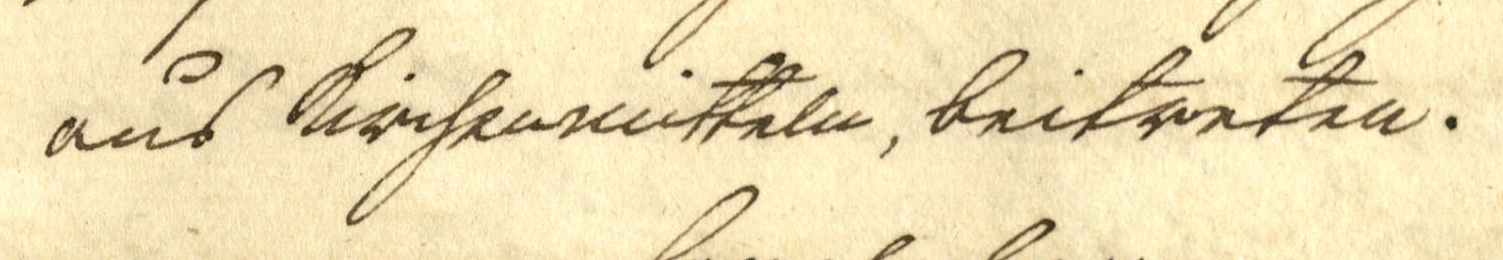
aus Kirchenmitteln, beitreten.
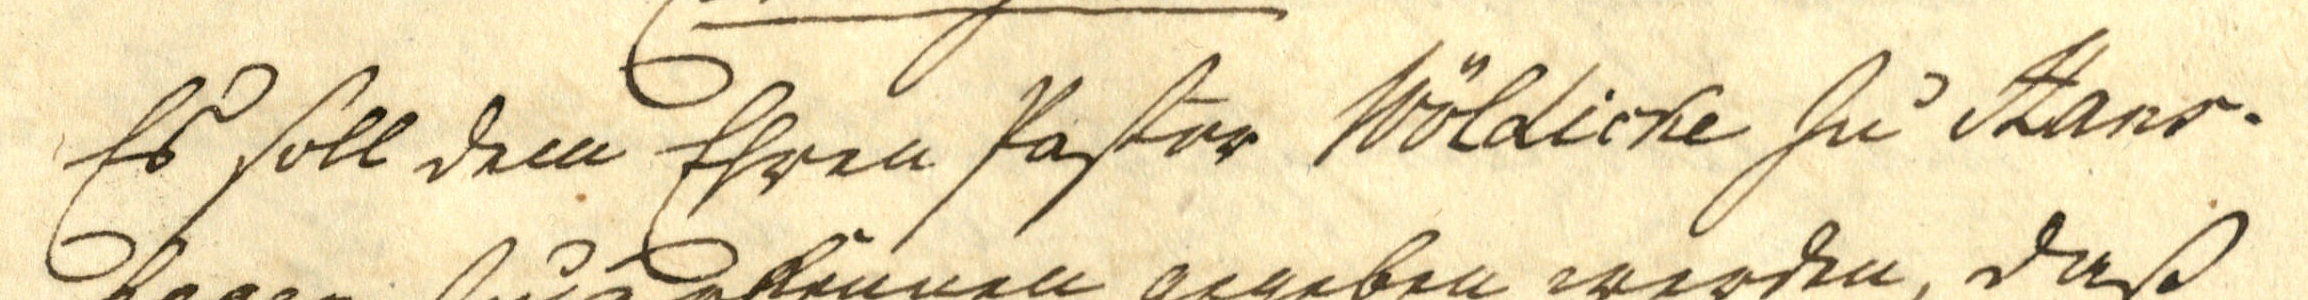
Es soll dem Ehren Pastor Wöldicke zu Hans¬
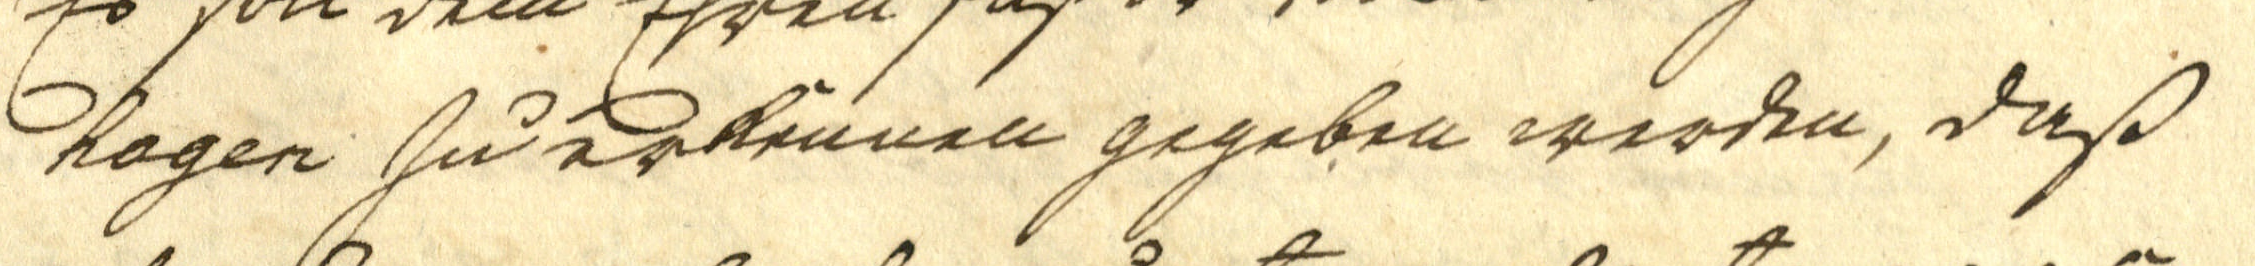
hagen zu erkennen gegeben werden, daß
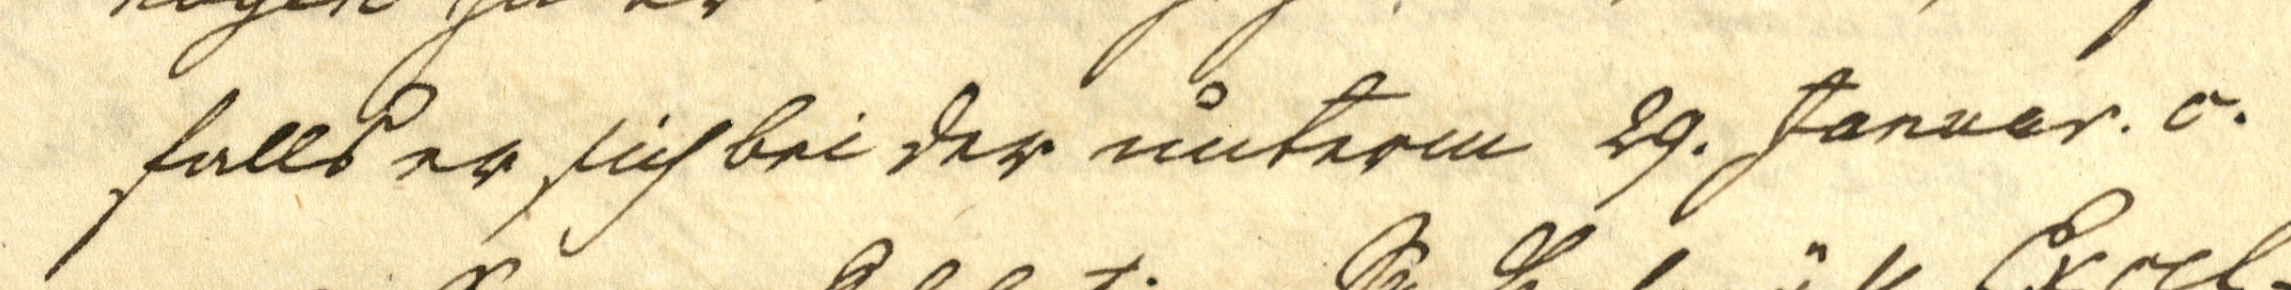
falls er sich bei der unterm 29. Januar c.
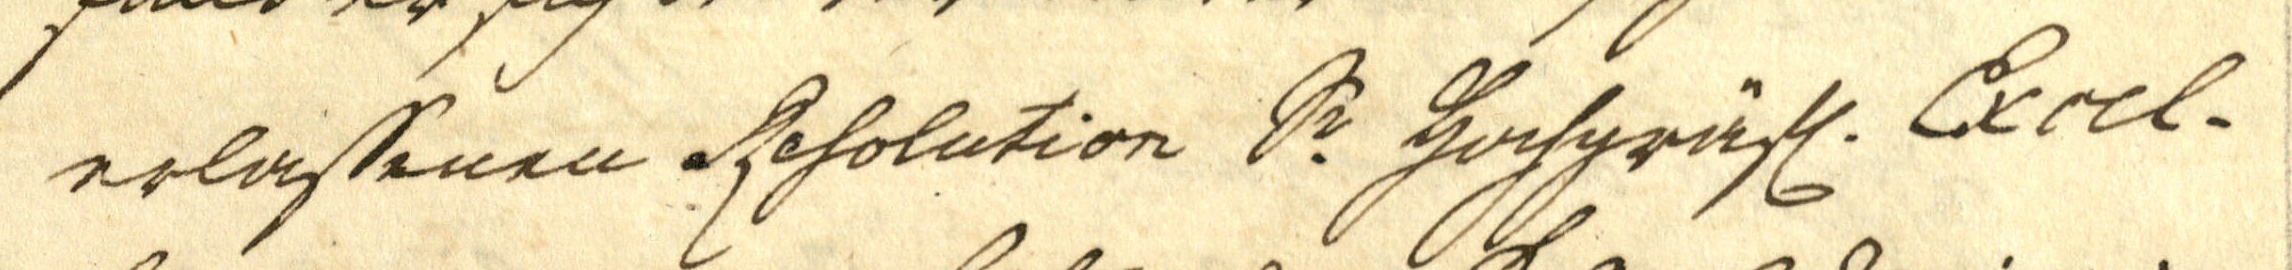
erlassenen Resolution Sr. Hochgräfl. Excel¬
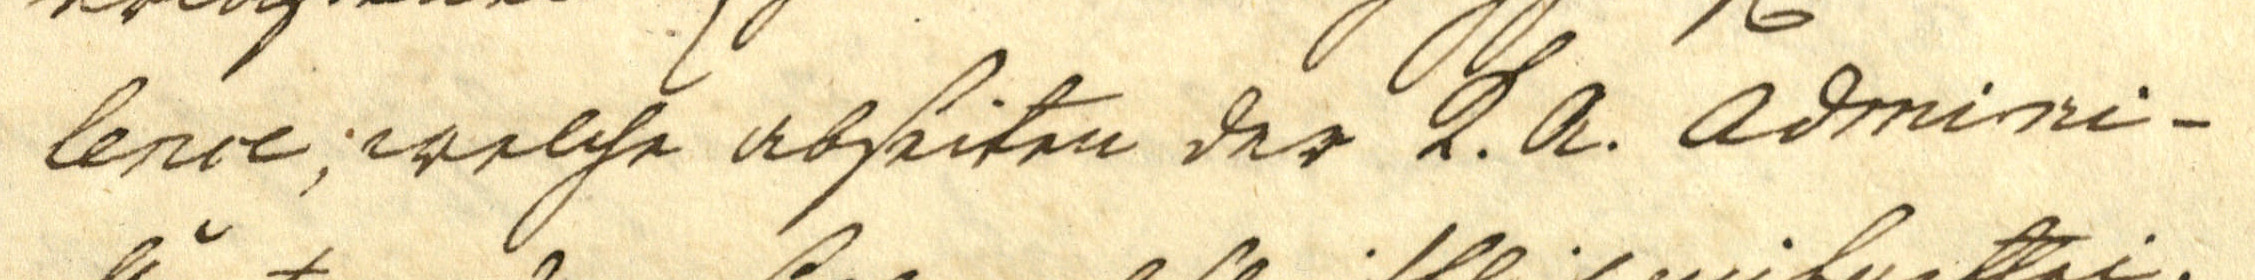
lence, welche abseiten der K. A. Admini¬
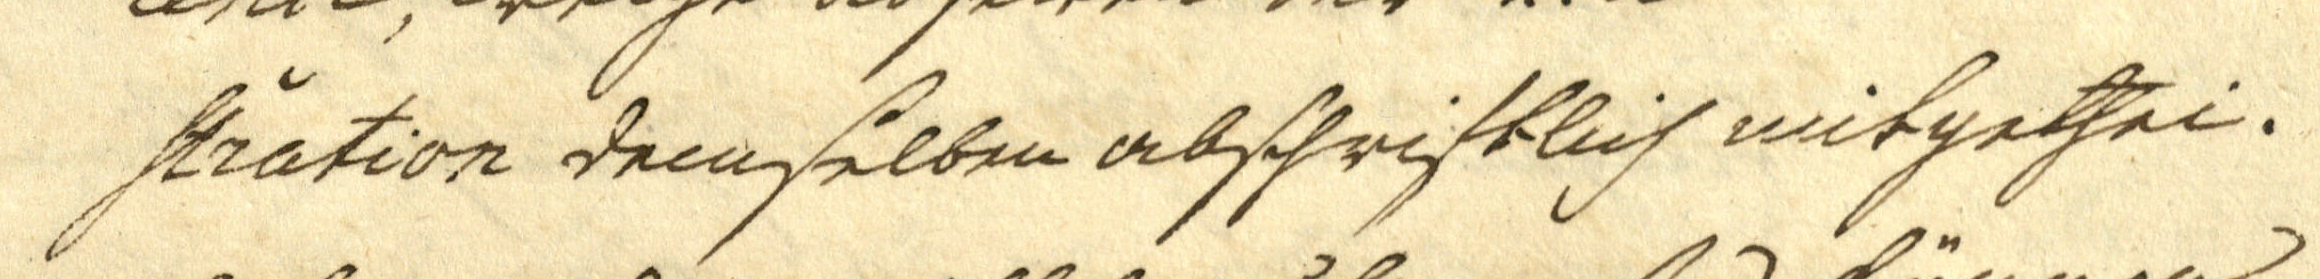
stration demselben abschriftlich mitgethei-
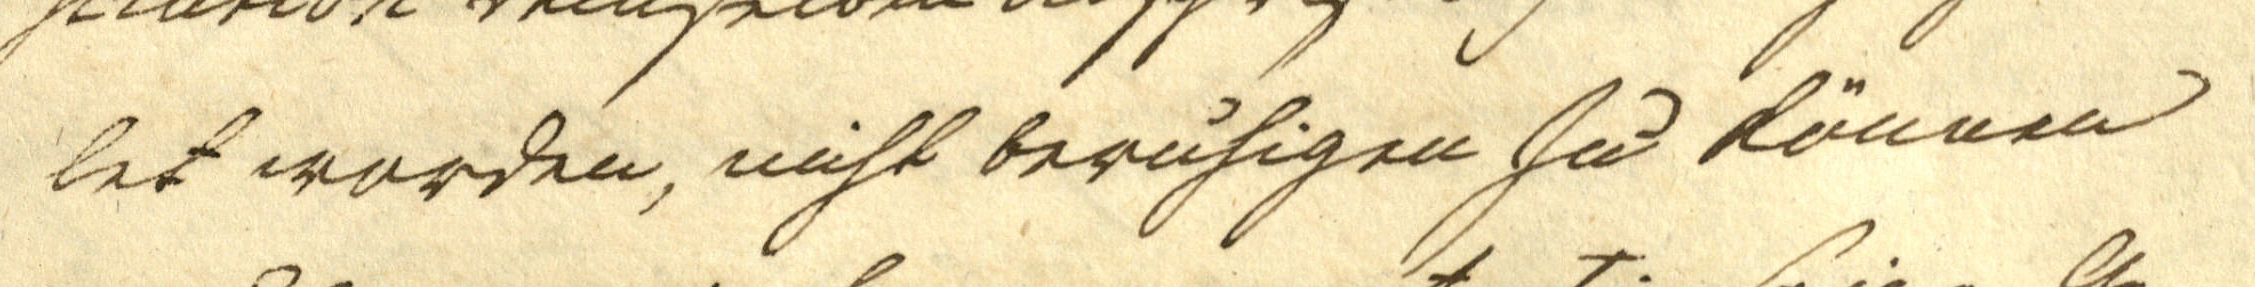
let worden, nicht beruhigen zu können
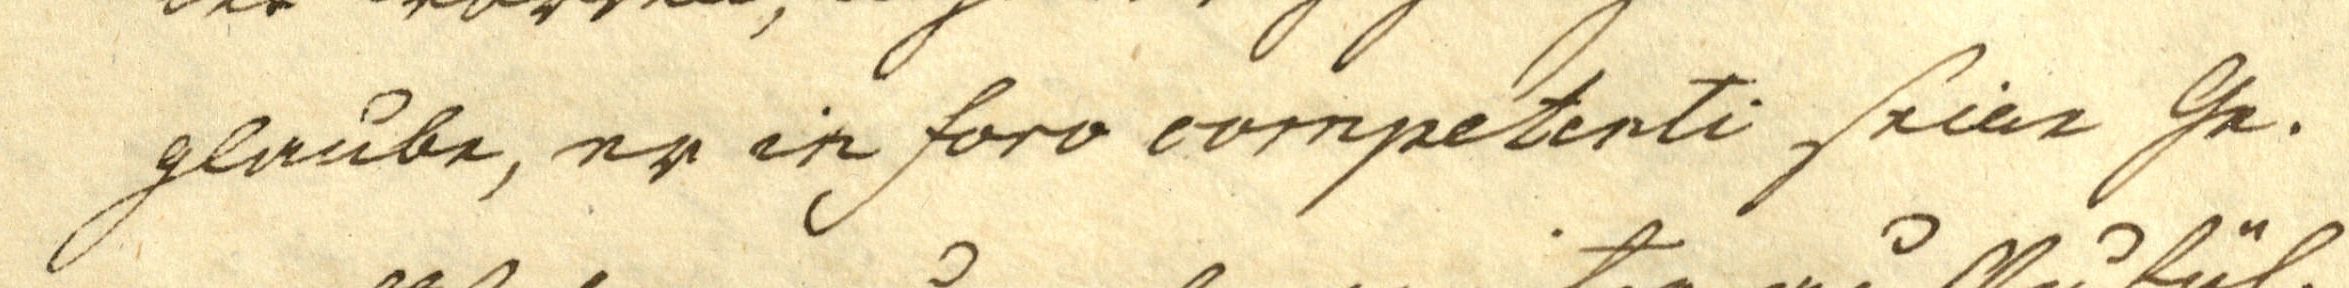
glaube, er in foro competenti seine Ge¬
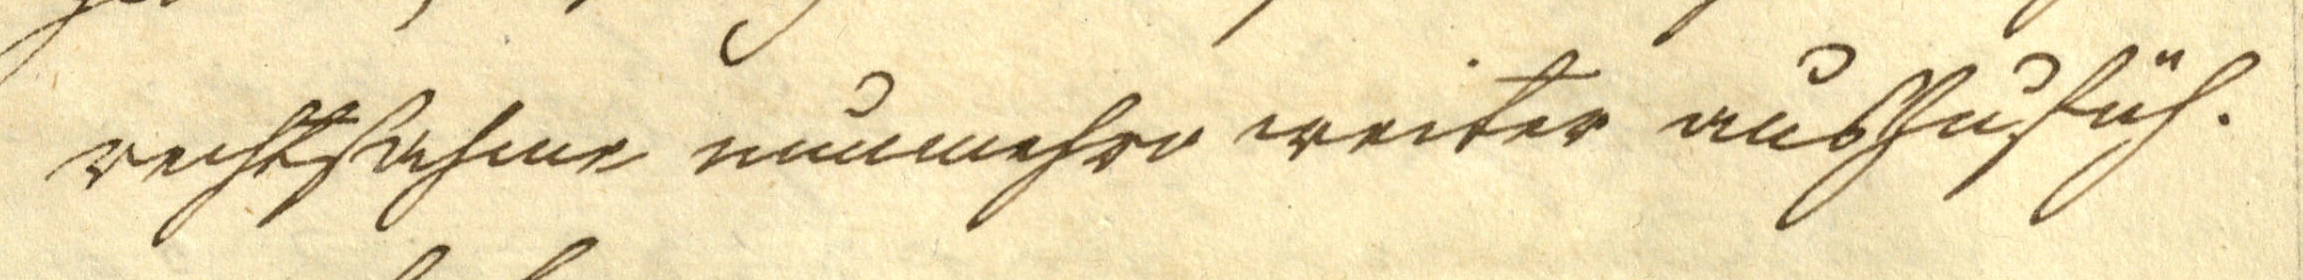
rechtsahme nunmehro weiter auszufüh¬
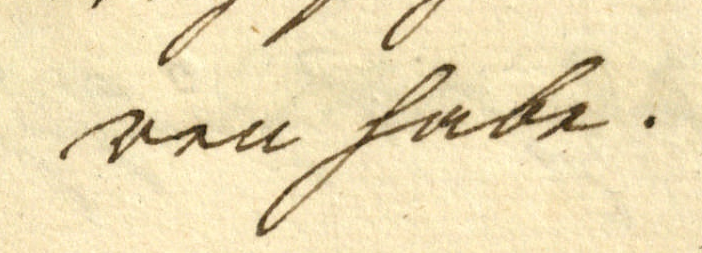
ren habe.
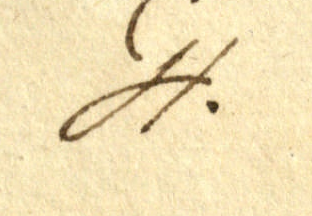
4.
